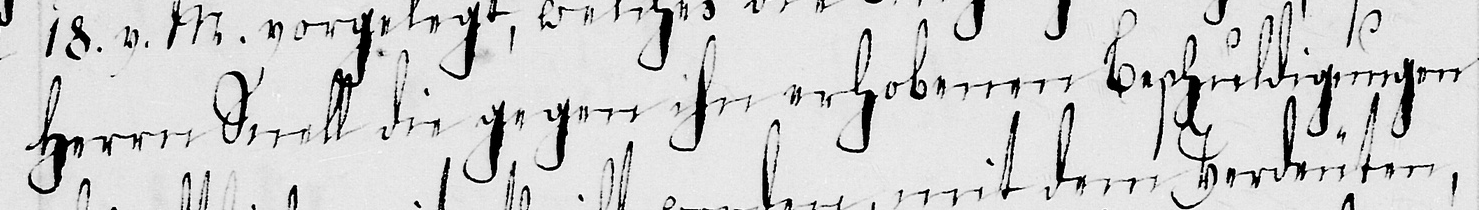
Herrn Snell die gegen ihn erhobenen Beschuldigungen
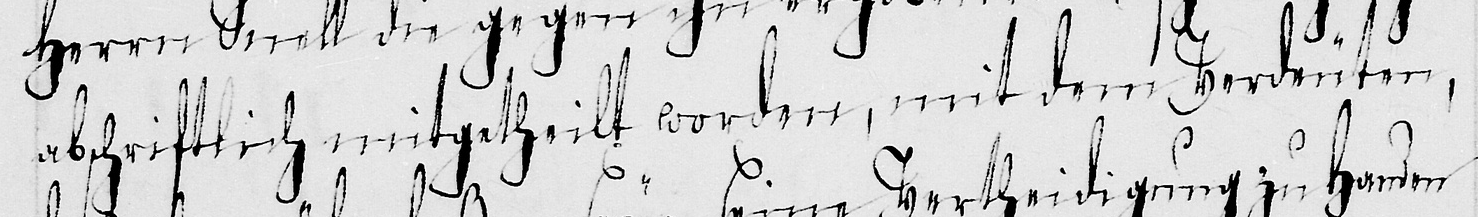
abschriftlich mitgetheilt worden, mit dem Verdeuten,
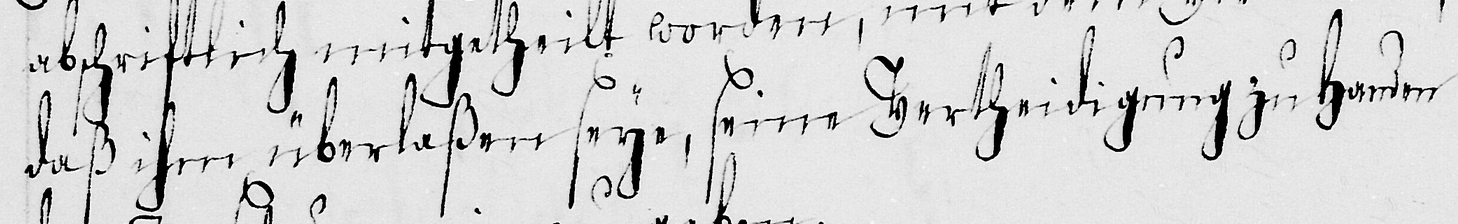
daß ihm überlaßen seye, seine Vertheidigung zu Handen
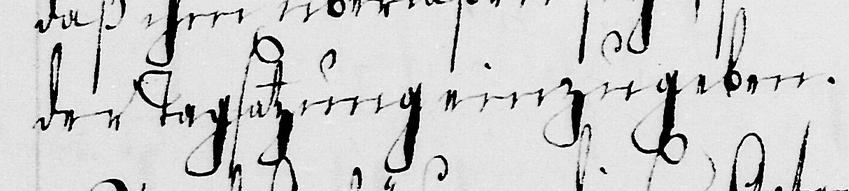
der Tagsatzung einzugeben.
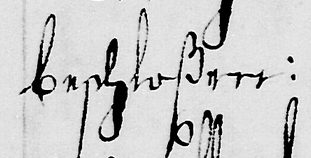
beschloßen:
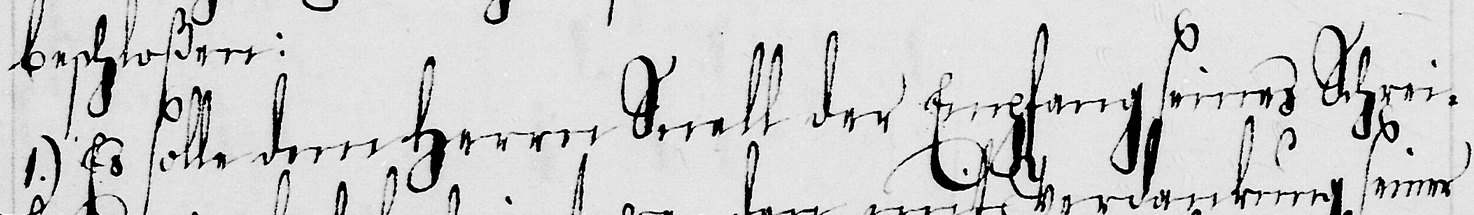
Es solle dem Herrn Snell der Empfang seines Schrei¬
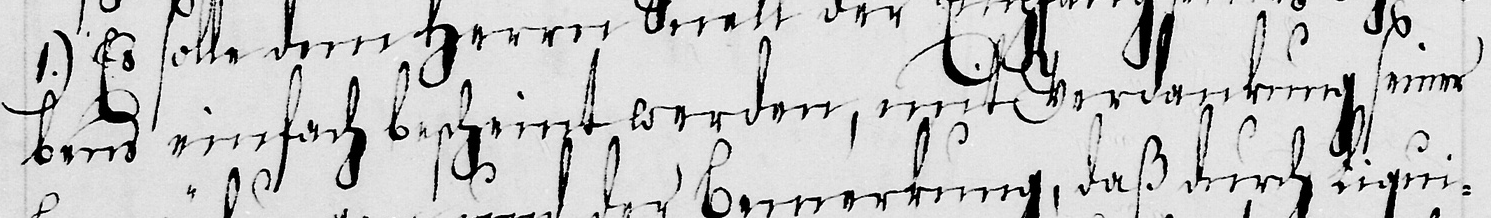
bens einfach bescheint werden, mit Verdankung seiner
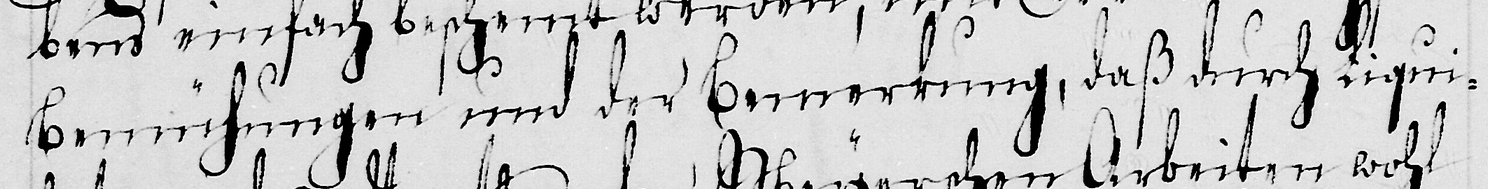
Bemühungen und der Bemerkung, daß durch Liqui¬
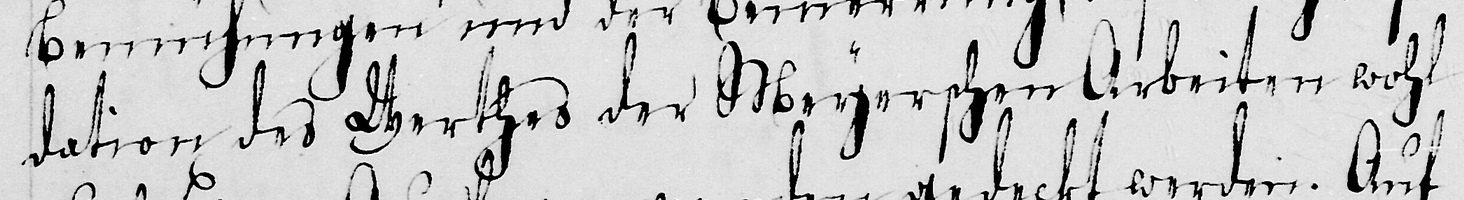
dation des Werthes der Meyerschen Arbeiten wohl
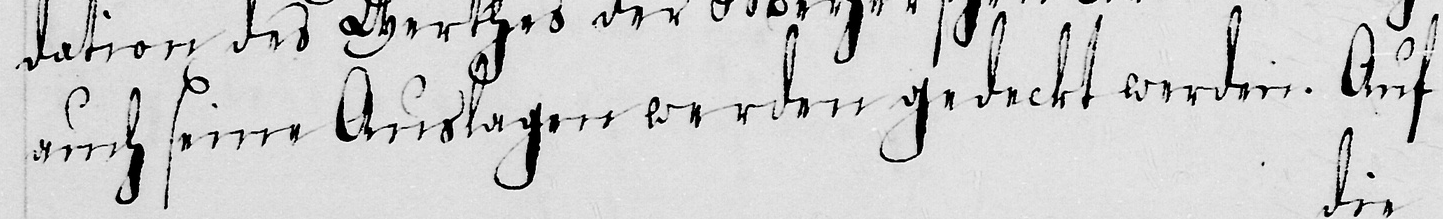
auch seine Auslagen werden gedeckt werden. Auf
